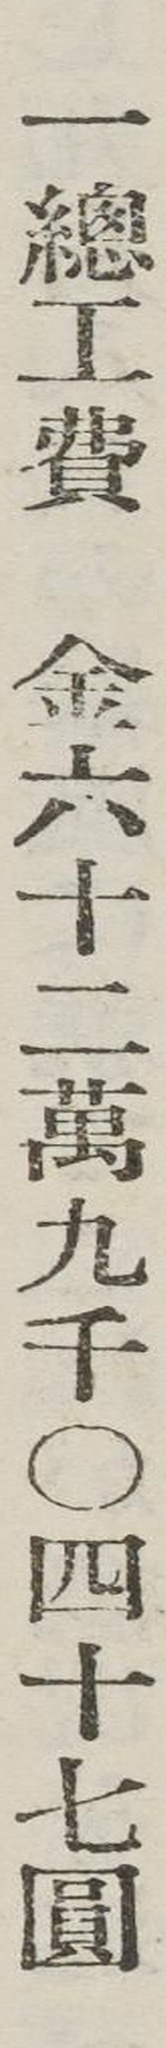一総工費金六十二万九千〇四十七円
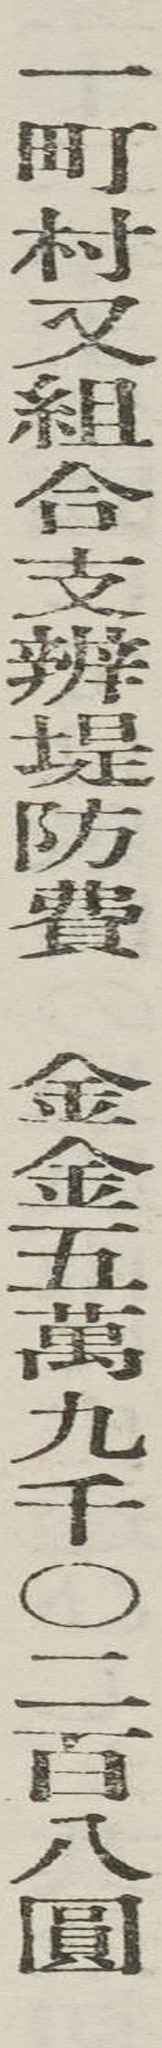一町村又組合支弁堤防費金金五万九千〇二百八円
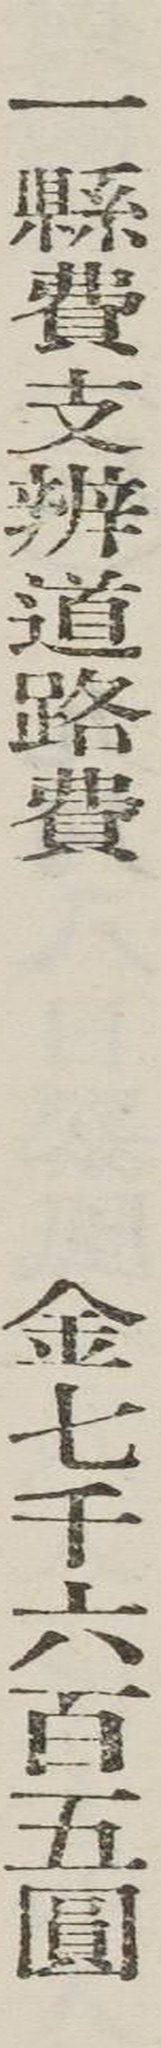一県費支弁道路費金七千六百五円

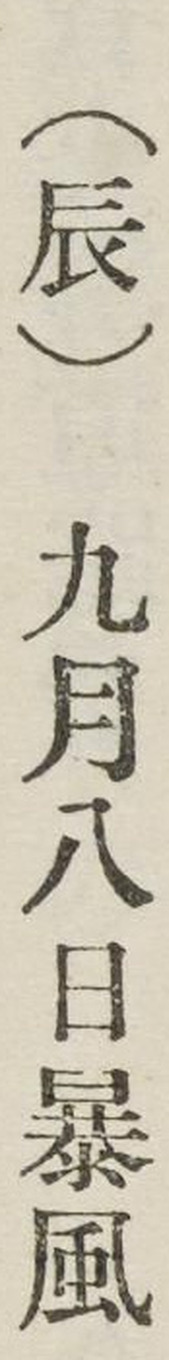九月八日暴風
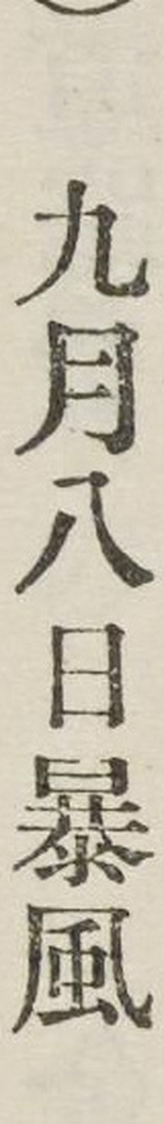九月八日暴風
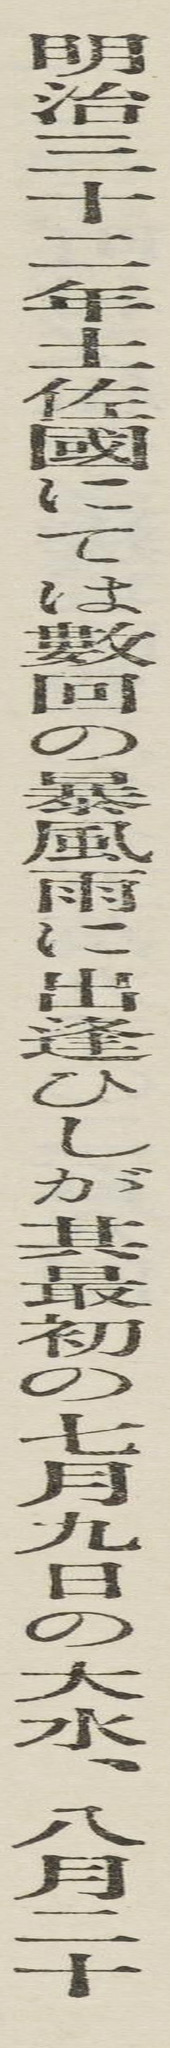明治三二年土佐国にては数回の暴風雨に出逢ひしが其最初の七月九日の大水、八月二十
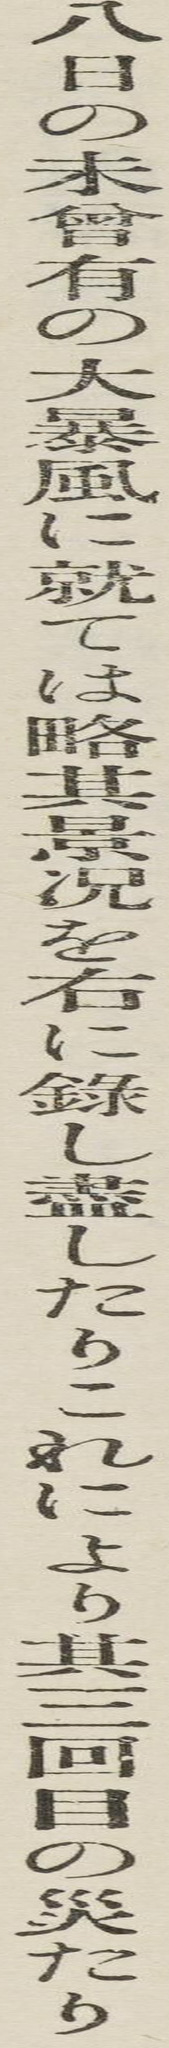八日の未曾有の大暴風に就ては略其景況を右に録し尽したりこれにより其三回目の災たり
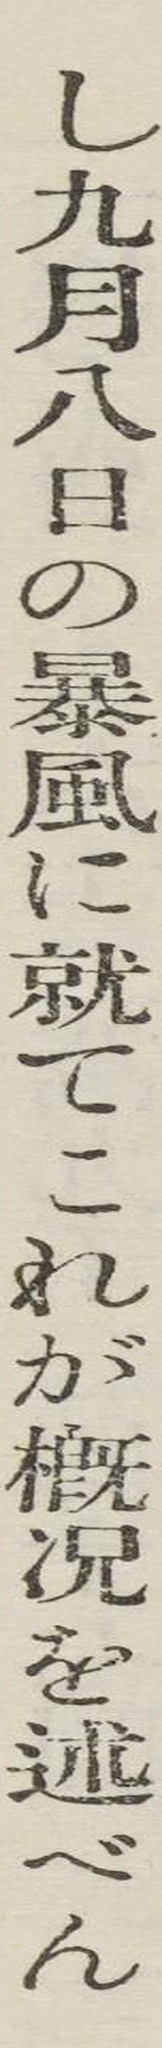し九月八日の暴風に就てこれが概況を述べん
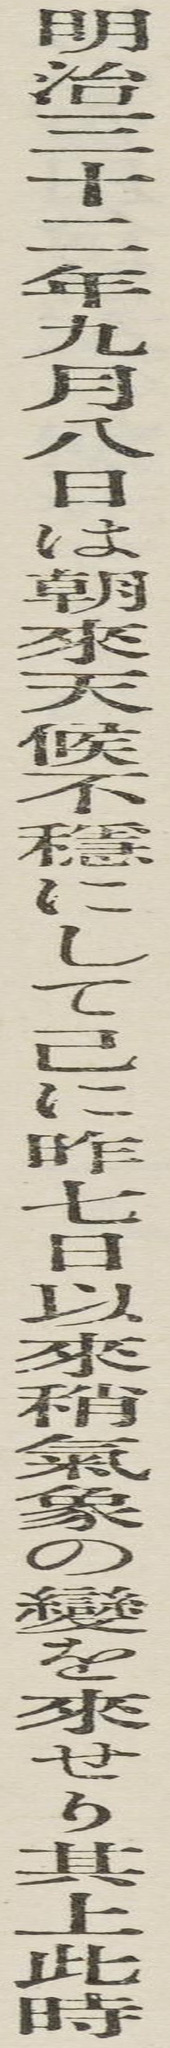明治三十二年九月八日は朝来天候不穏にして己に昨七日以来稍気象の変を来せり其上此時
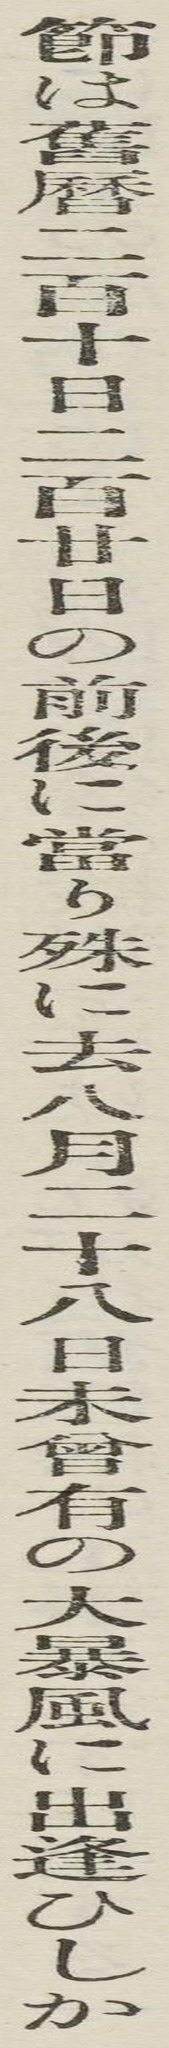節は旧暦二百十日二百廿日の前後に当り殊に去八月二十八日未曾有の大暴風に出逢ひしか
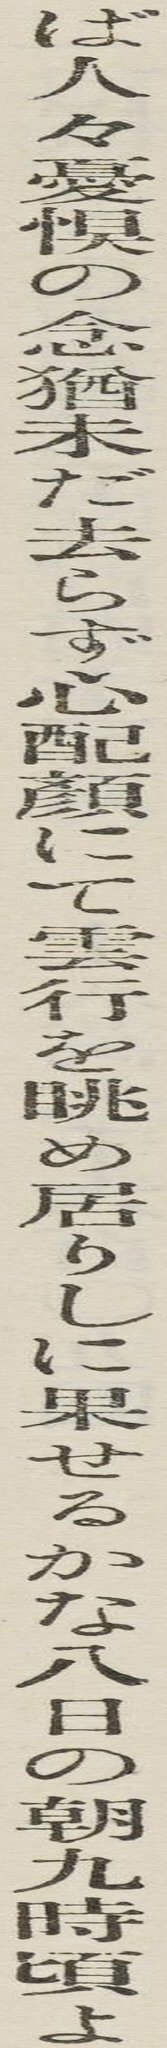ば人々憂惧の念猶未だ去らず心配顔にて雲行を眺め居りしに果せるかな八日の朝九時頃よ
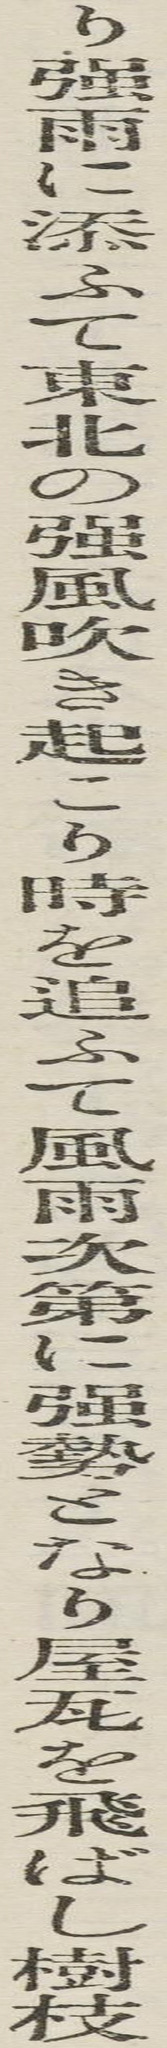り強雨に添ふて東北の強風吹き起こり時を追ふて風雨次第に強勢となり屋瓦を飛ばし樹枝
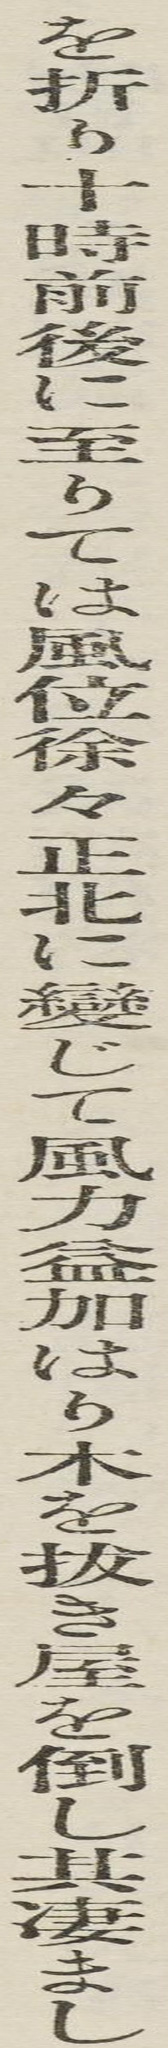を折り十時前後に至りては風位徐々正北に変じて風力益加はり木を抜き屋を倒し其凄まし
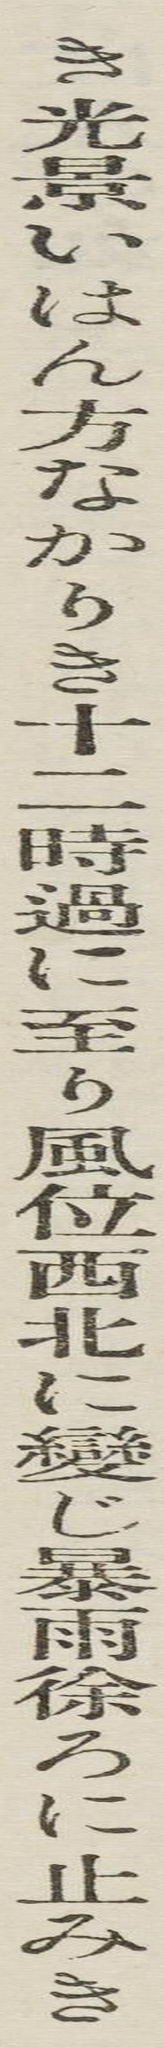き光景いはん方なかりき十二時過に至り風位西北に変じ暴雨徐ろに止みき
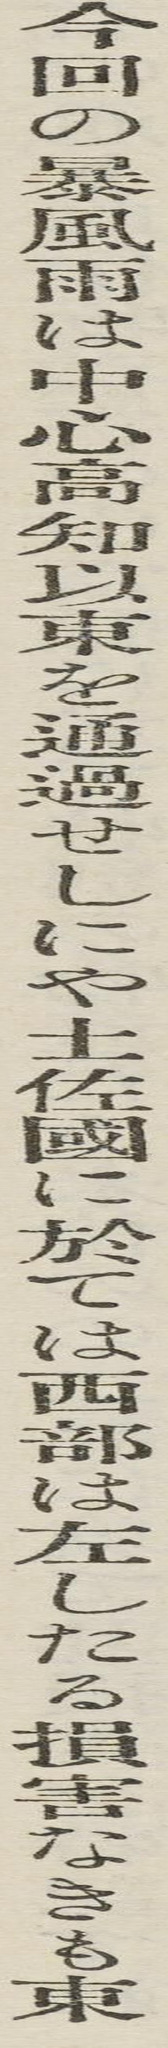今回の暴風雨は中心高知以東を通過せしにや土佐国に於ては西部は左したる損害なきも東
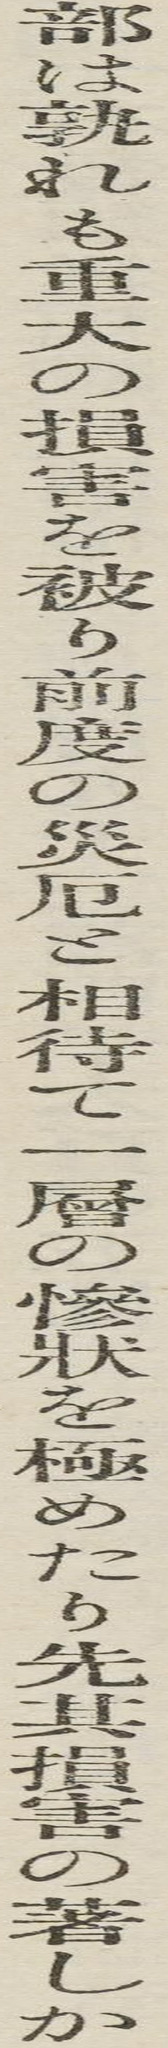部は孰れも重大の損害を被り前度の災厄と相待て一層の惨状を極めたり先其損害の著しか
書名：土佐古今ノ地震
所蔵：東京大学地震研究所図書室 Earthquake Research Institute Library, The University of Tokyo, JAPAN
